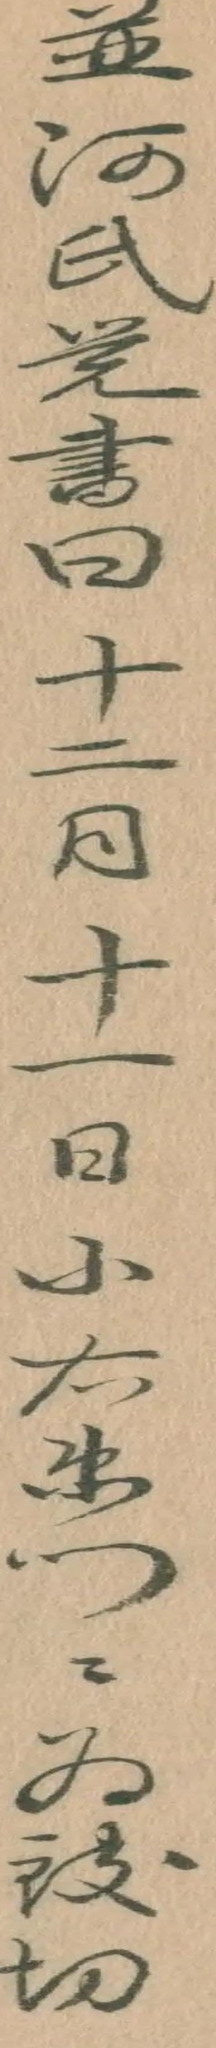並河氏覚書曰十二月十一日小右衛門にゐ致切
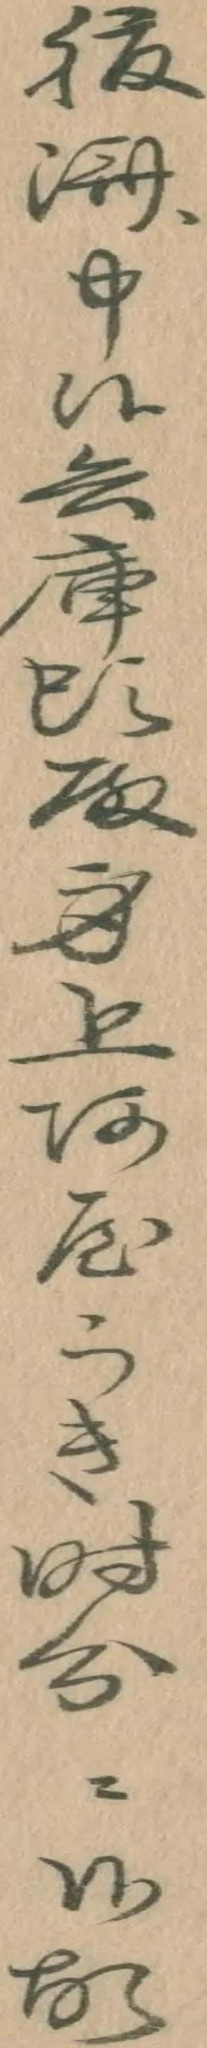抜済申候兵庫頭殿身上阿屋うき時分に候故
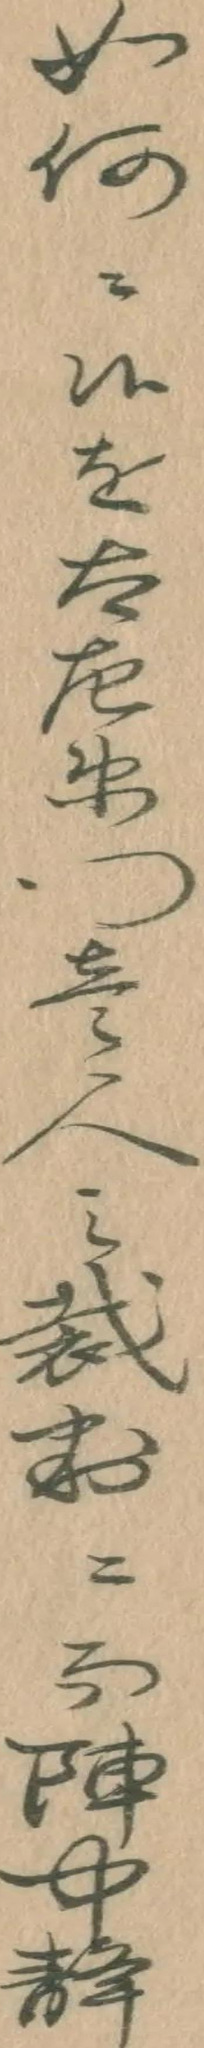如何に候を太左衛門壱人之裁判に而陣中静
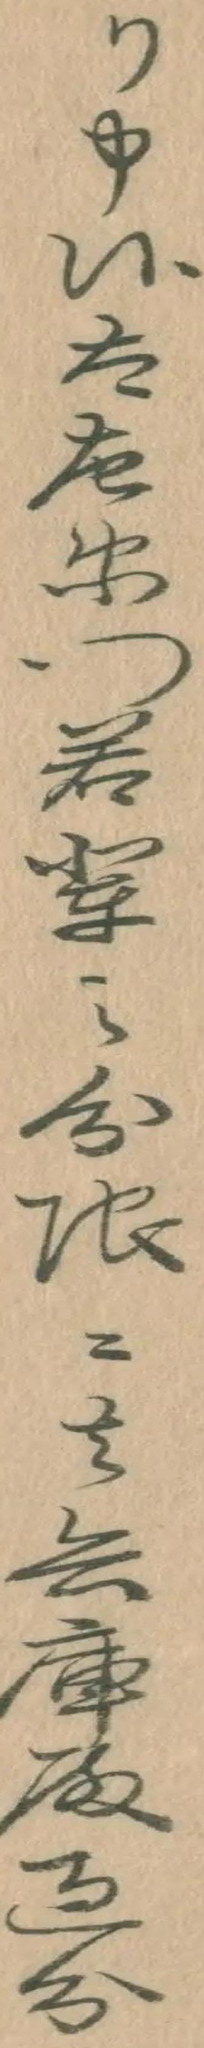り申候太左衛門若輩之分限に者兵庫殿過分
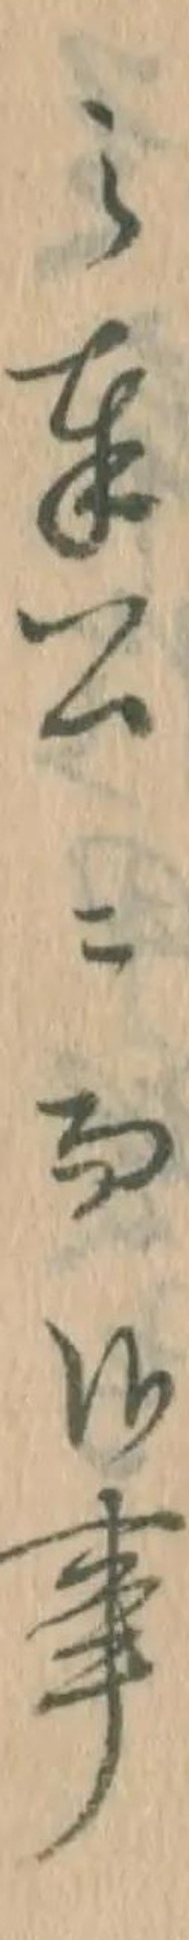之奉公に而候事
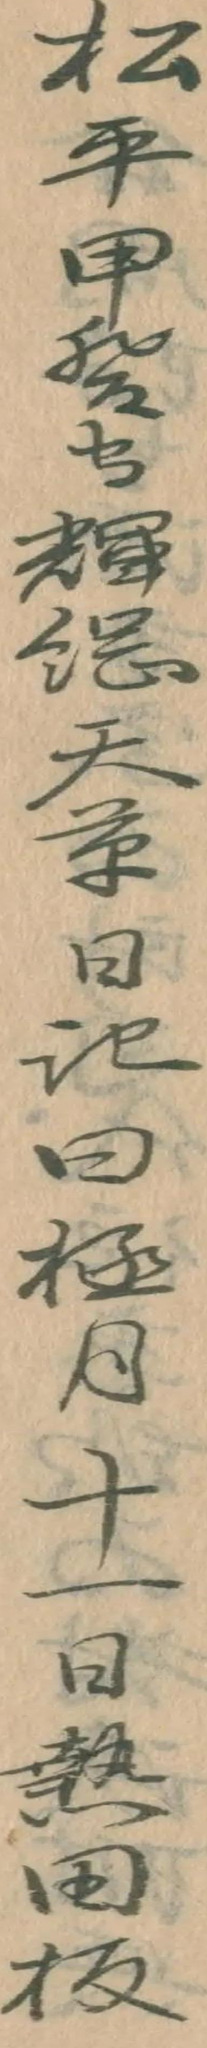松平甲斐守輝綱天草日記曰極月十一日熱田板

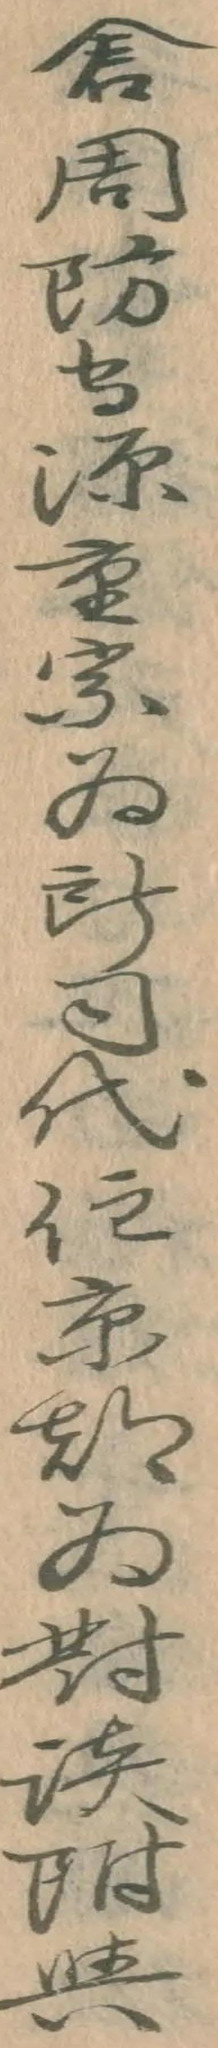倉周防守源重宗ゐ所司代住京都ゐ対談附夜與
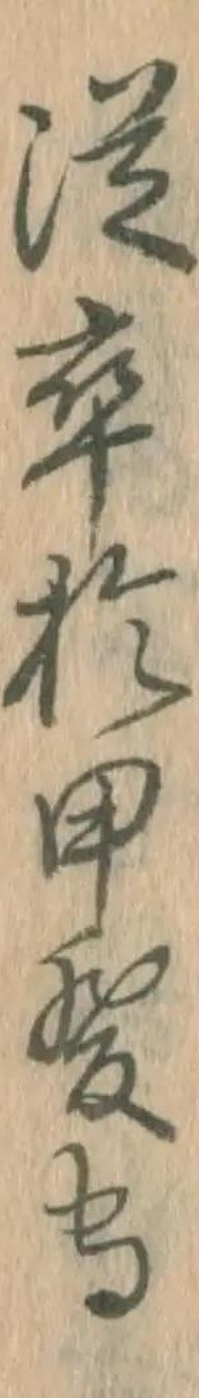従卒於甲斐守

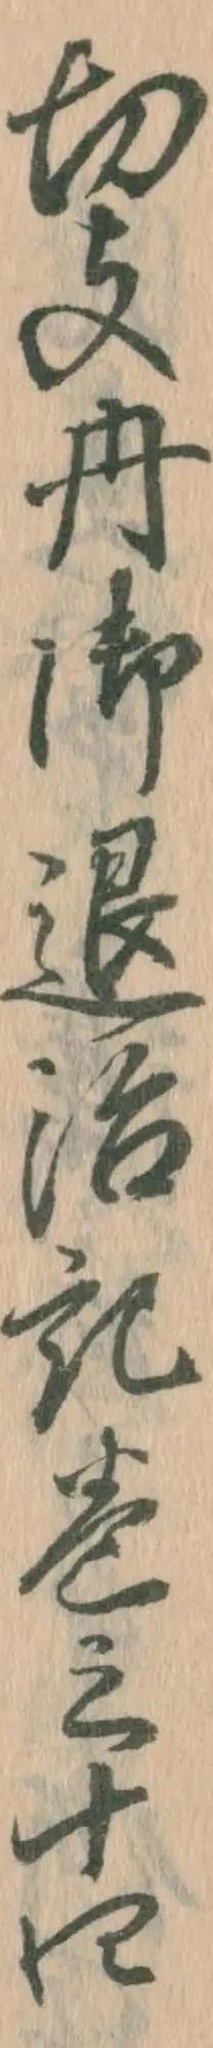切支丹御退治記巻三十四
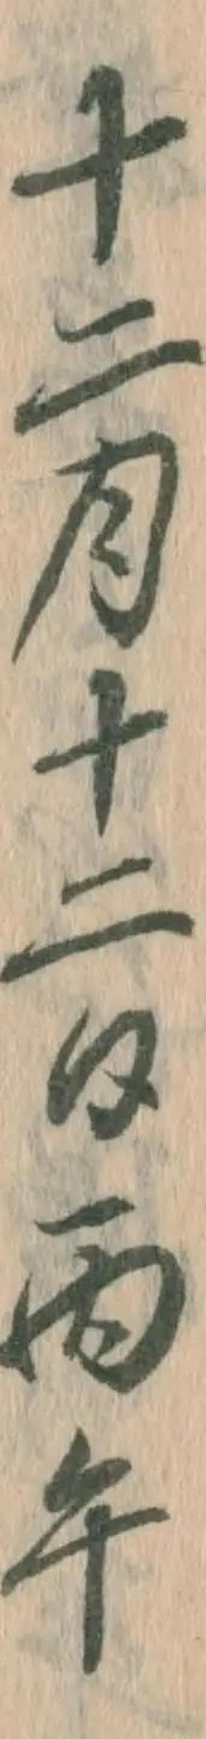十二月十二日丙午
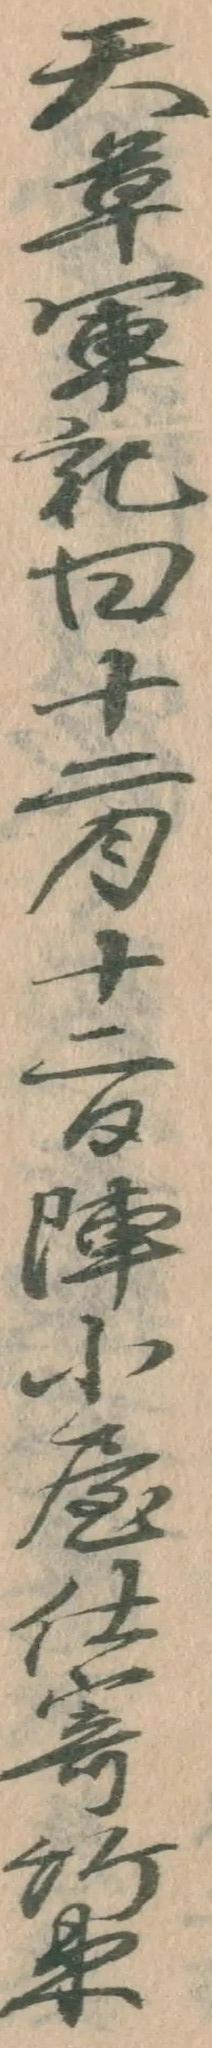天草軍記曰十二月十二日陣小屋仕寄竹束
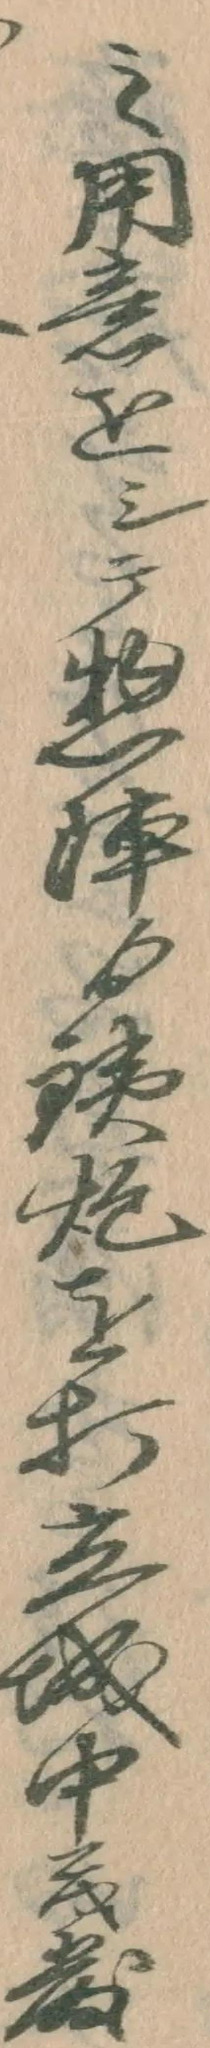之用意をして惣陣ゟ鉄炮を打立城中茂厳
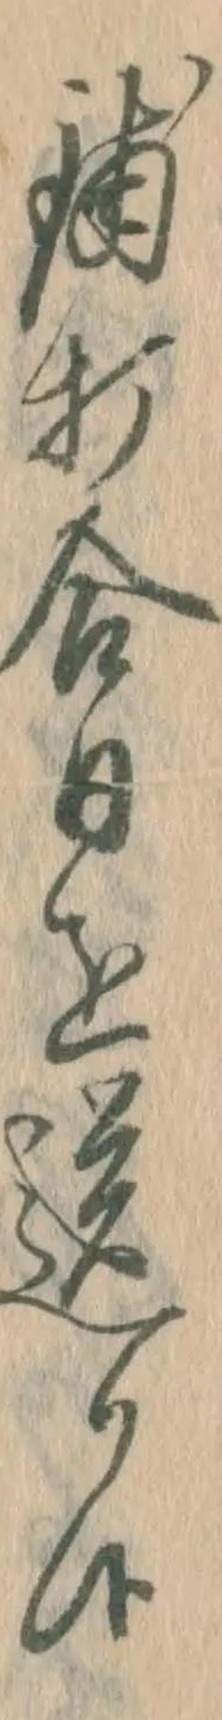鋪打合日を送り候
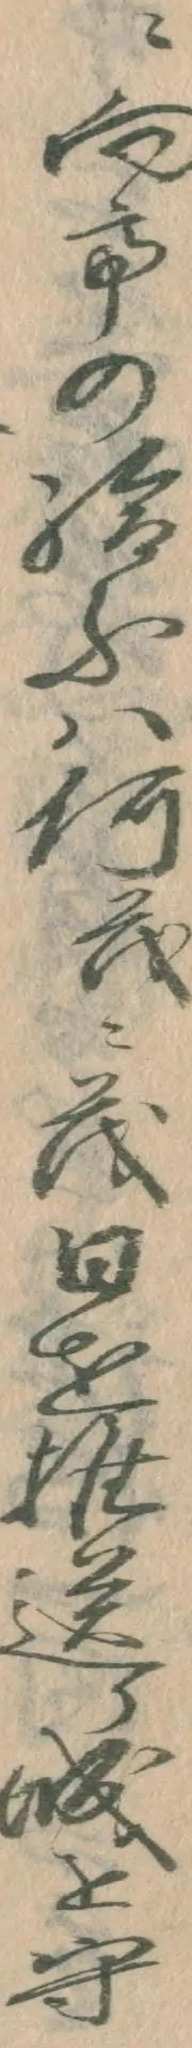に向亭の給ふは何茂日を推送り城を守
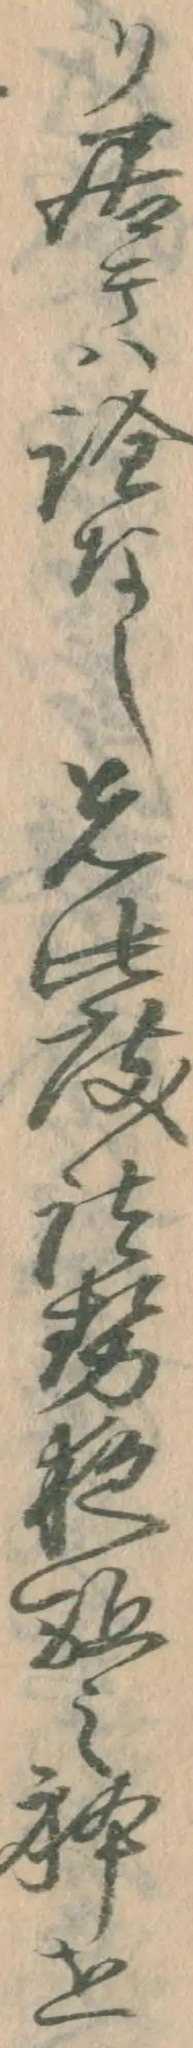り居ては詮なし先此度諸勢夜駈之躰を
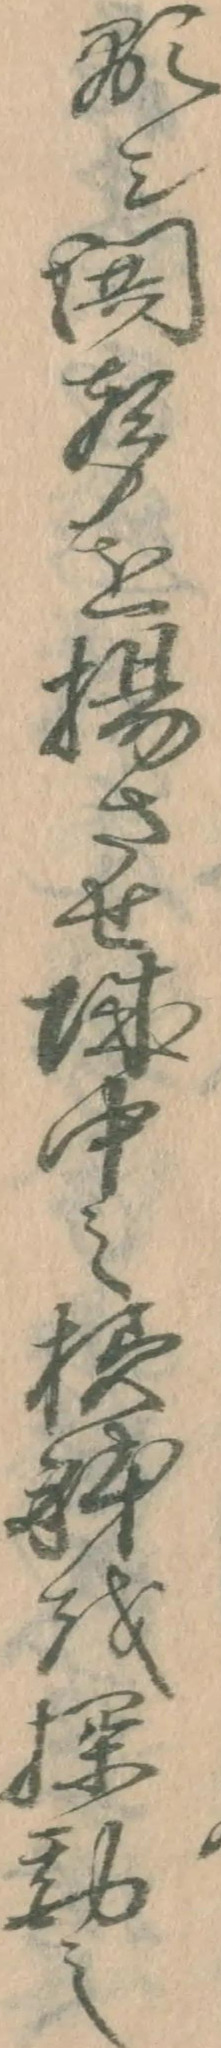顕し鬨声を揚させ城中之様躰越探勤之
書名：切支丹御退治記 49巻. [4]
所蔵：国立国会図書館 National Diet Library, JAPAN
